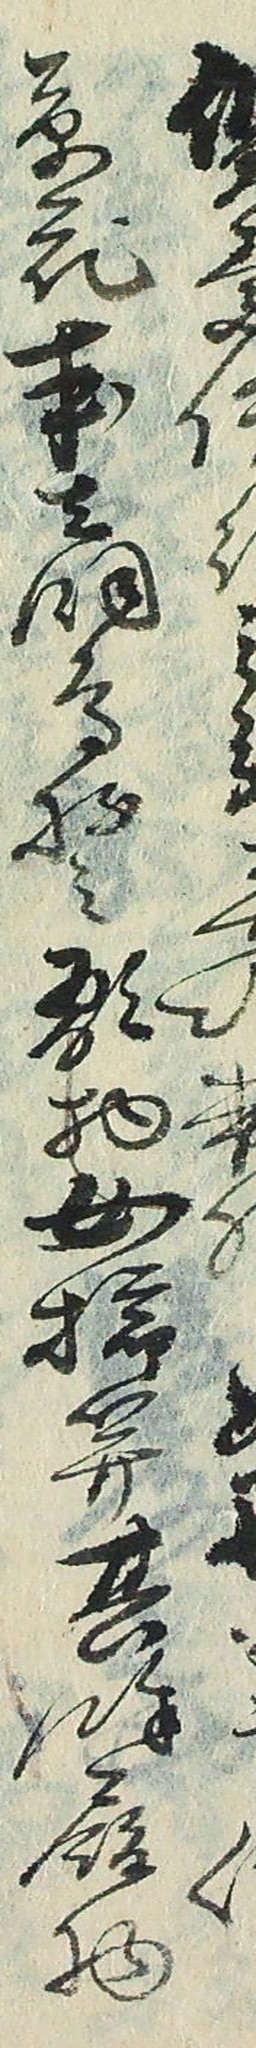草花或は飼鳥抔之翫物女櫛笄其余履物
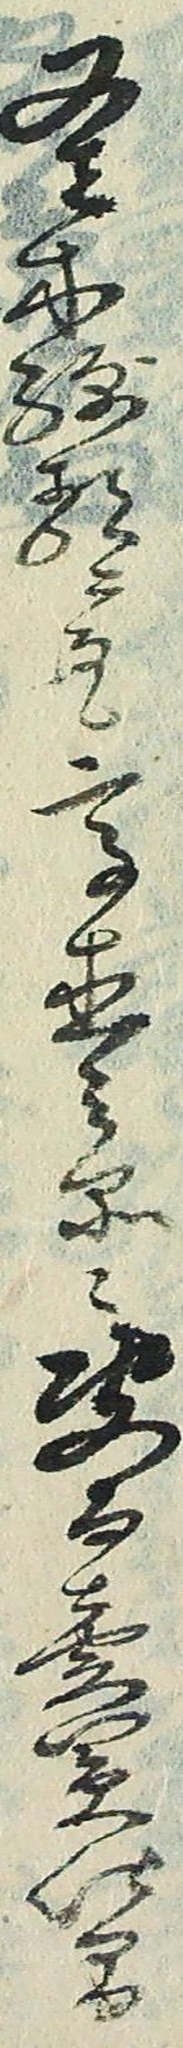又は木綿類に而も高直之品々決而売買仕間
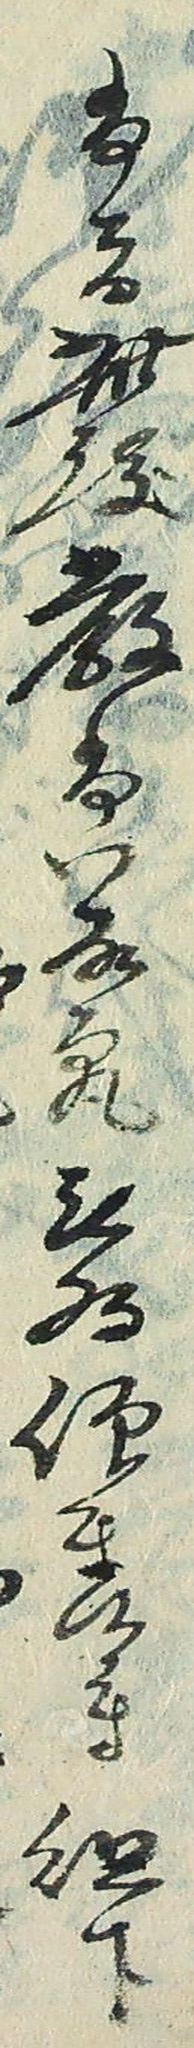布旨此度厳布御取究被為仰付候に付組下
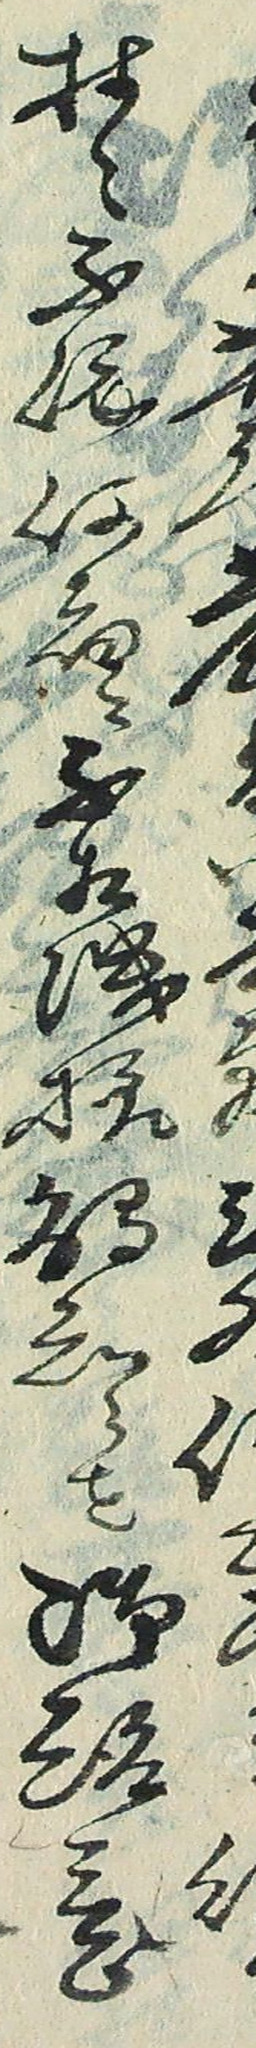村々不依何者に不相漏様触知らせ御趣意
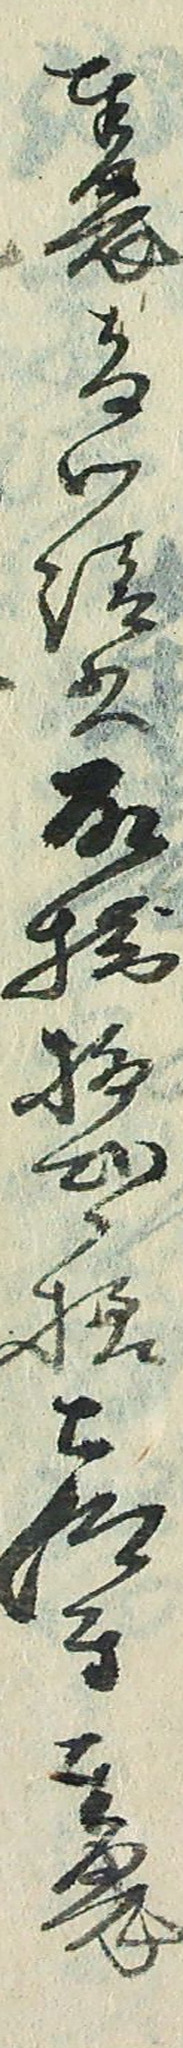奉畏旨御請書取揃指出候様被仰付奉畏
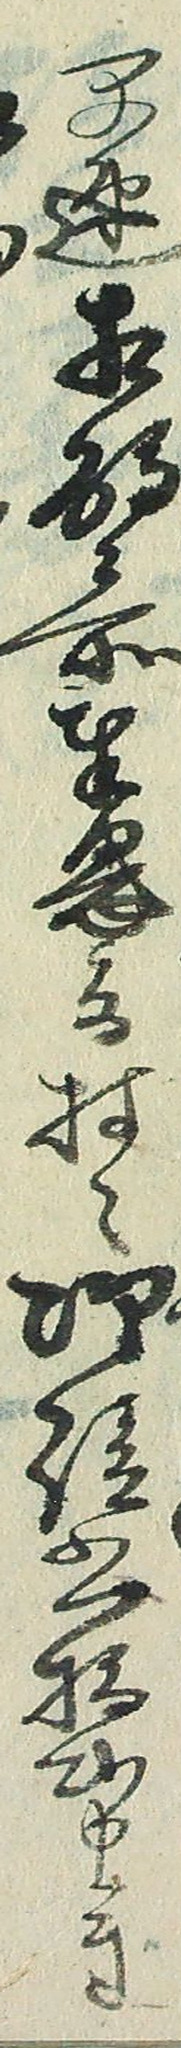早速相触候所奉畏旨旨村々御請書指出申に付
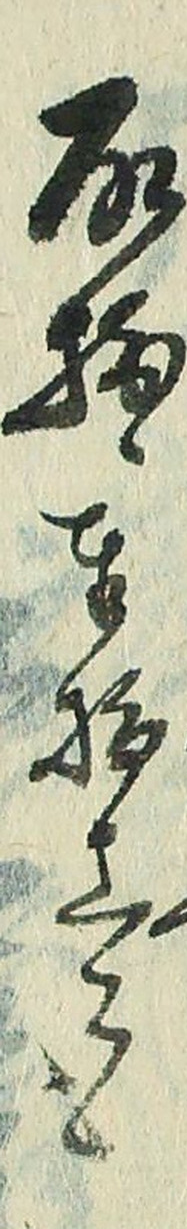取揃奉指上候以上
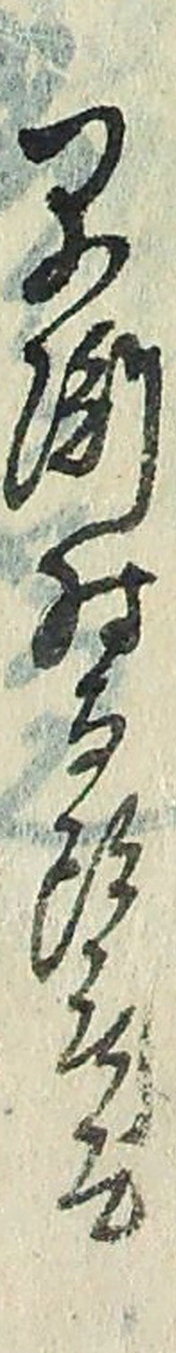早淵村与頭庄屋
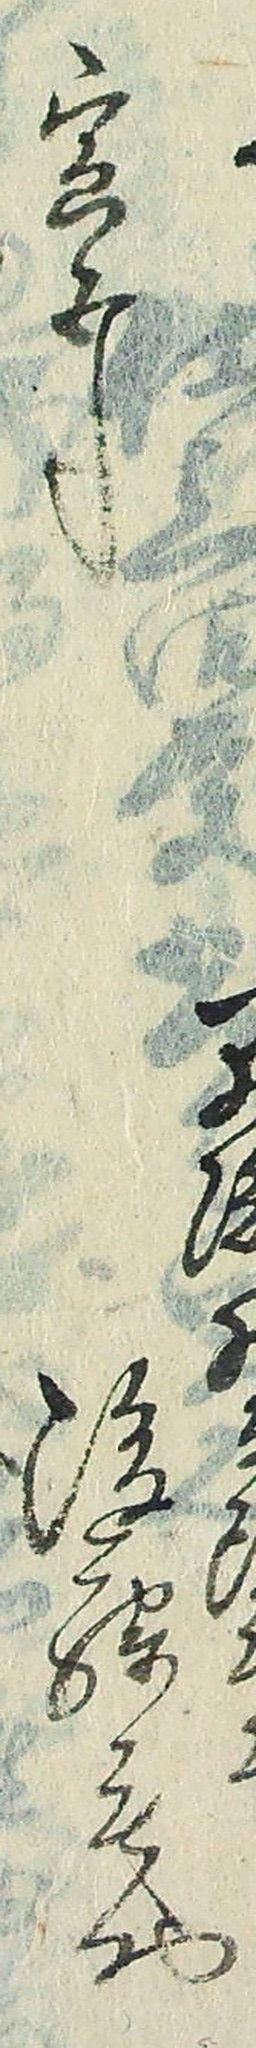寅五月後藤庄助
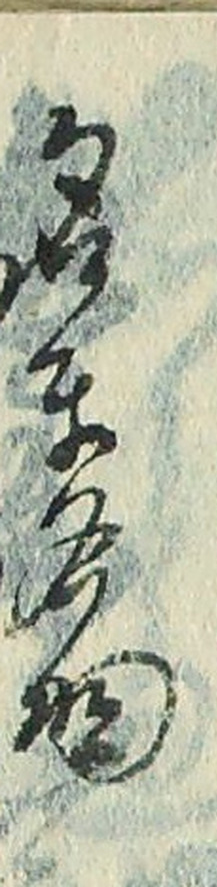名東名西
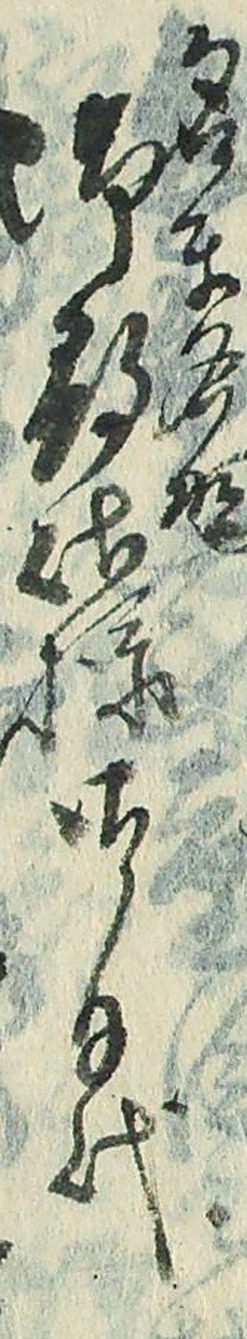御郡代様御手代
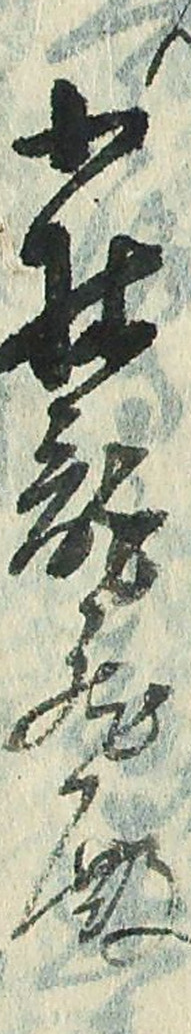小林龍蔵殿
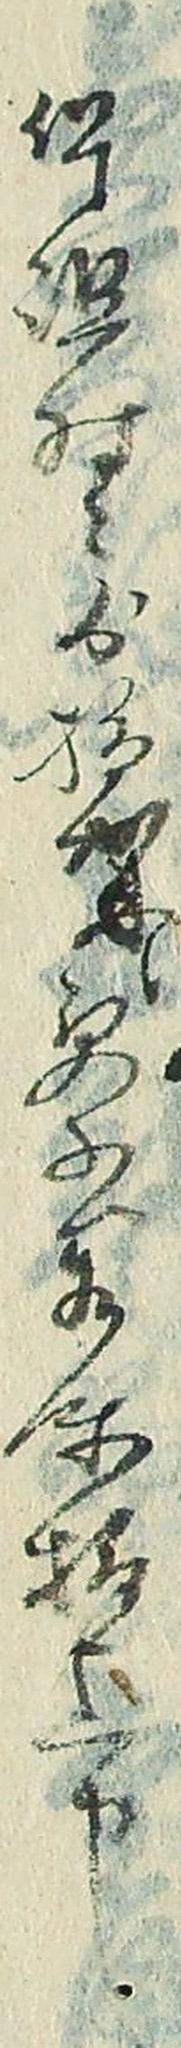但し組村々ゟ指出来候受書相添指上申候

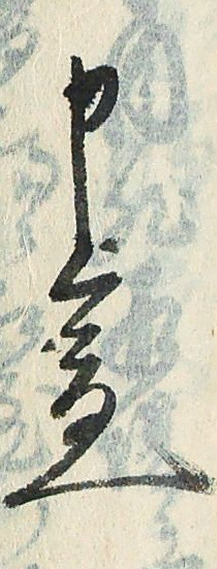申上覚
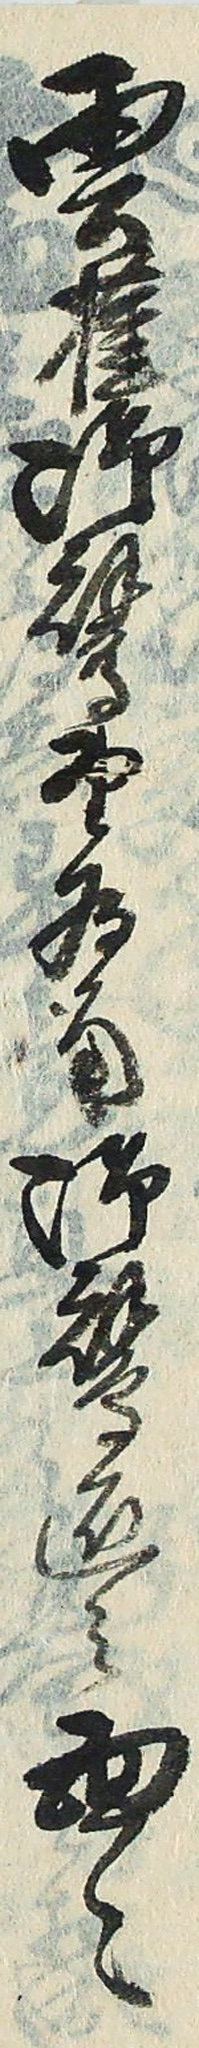雲雀御鷹野為御用御鷹匠之面々
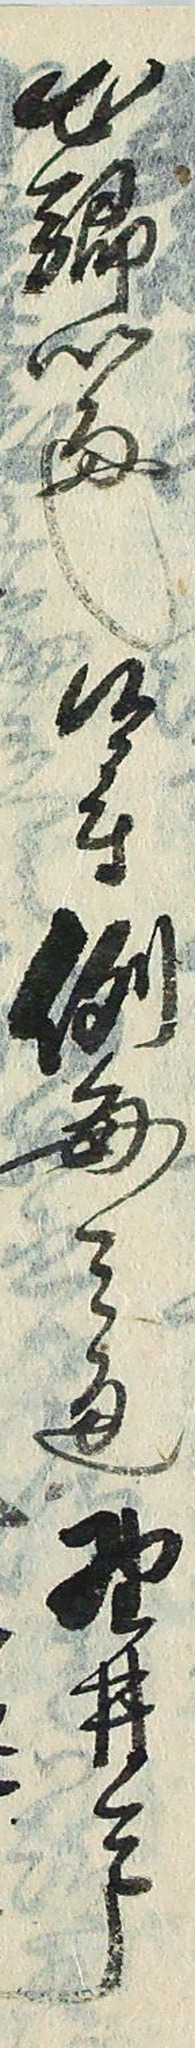出郷いたし候に付例毎之通野井戸
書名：諸御用御□受書控
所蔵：鳴門教育大学 Naruto University of Education
